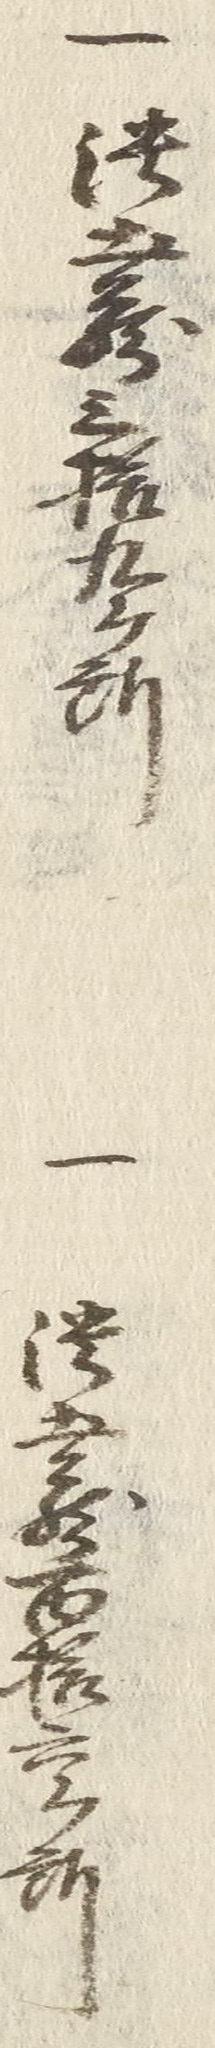一潰土蔵三拾九ヶ所一潰土蔵百拾六ヶ所
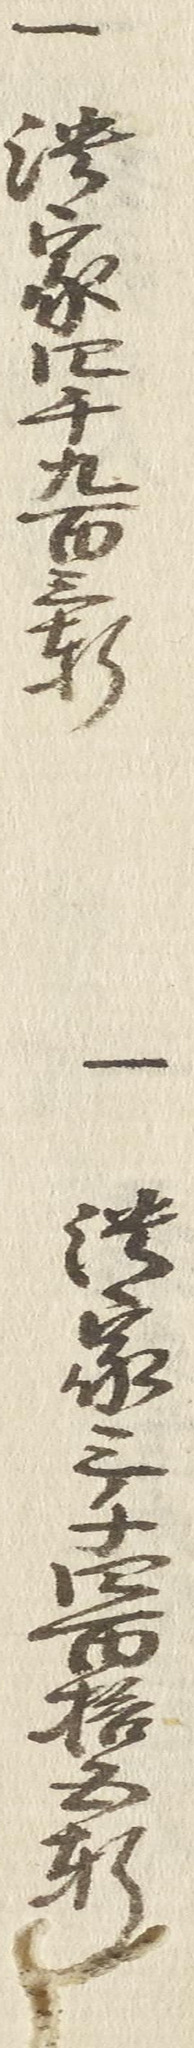一潰家四千九百三軒一潰家三千四百拾五軒
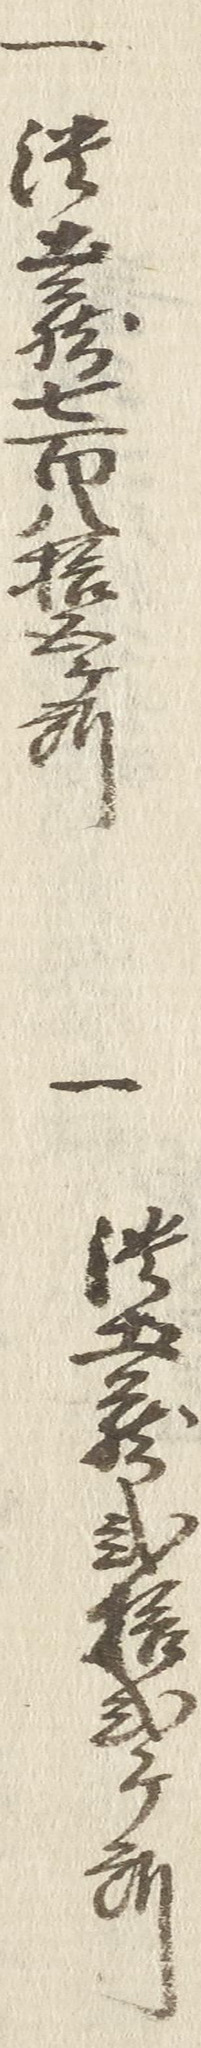一潰土蔵七百八拾五ヶ所一潰土蔵弐拾弐ヶ所
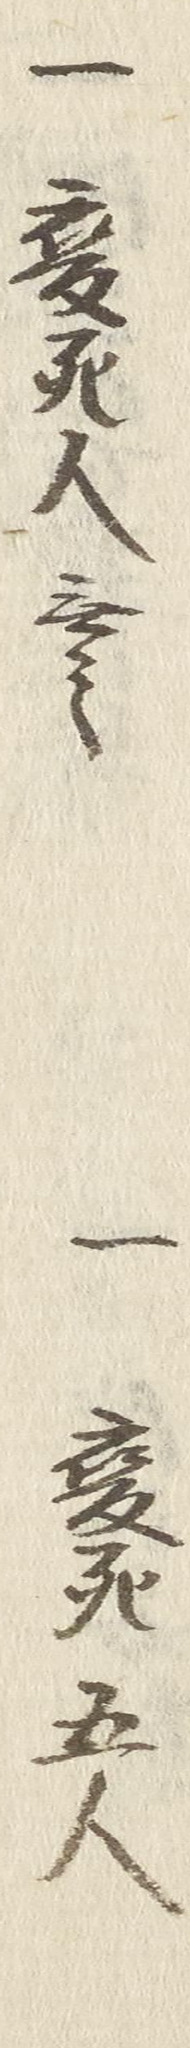一変死人無之一変死五人
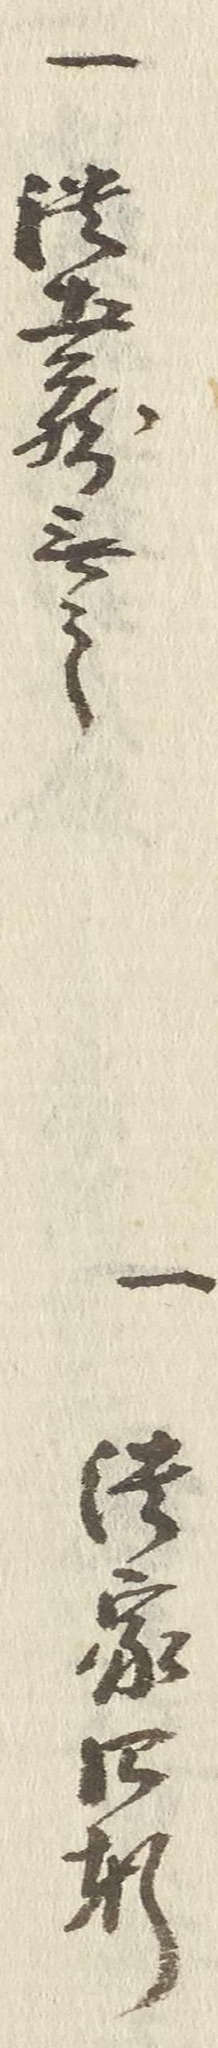一潰土蔵無之一潰家四軒
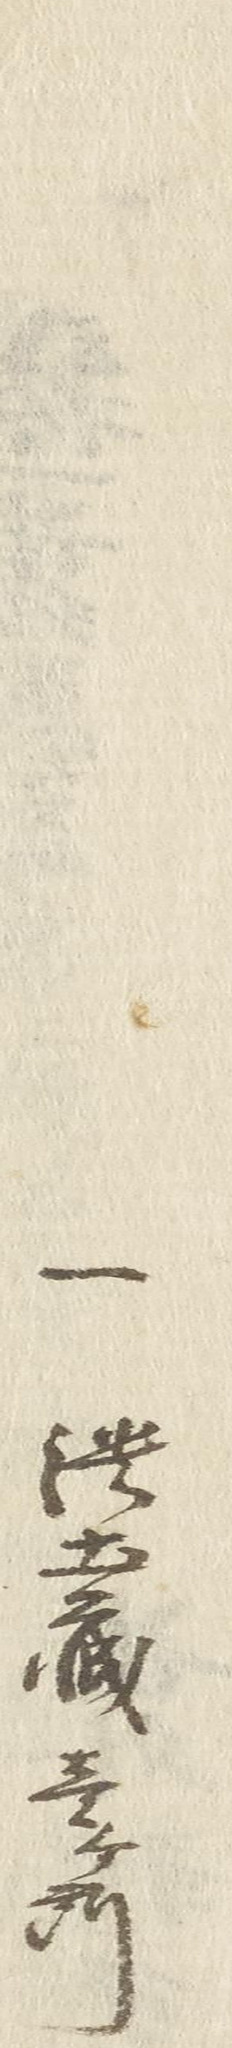一潰土蔵壱ヶ所
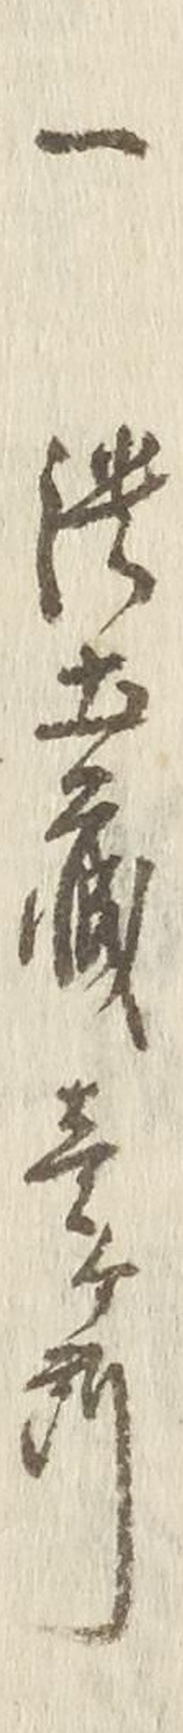一潰土蔵壱ヶ所

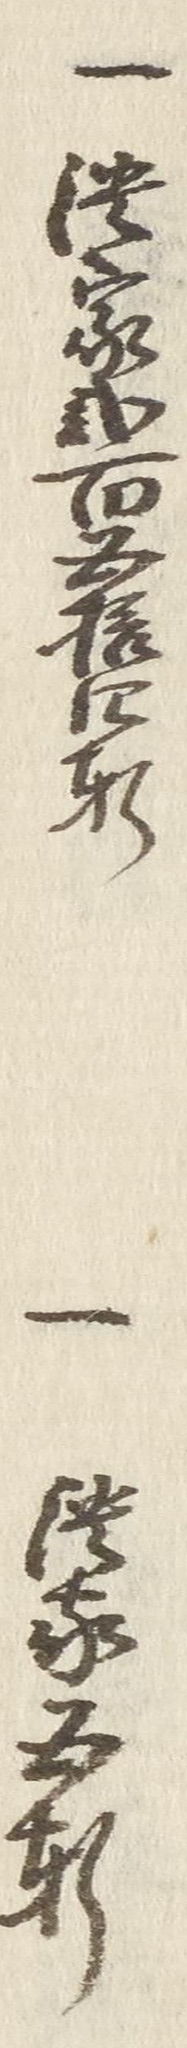一潰家弐百五拾四軒一潰家五軒
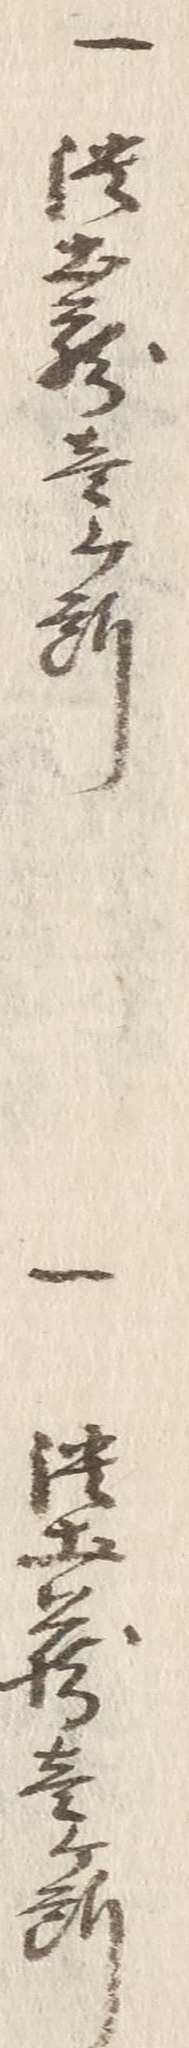一潰土蔵壱ヶ所一潰土蔵壱ヶ所
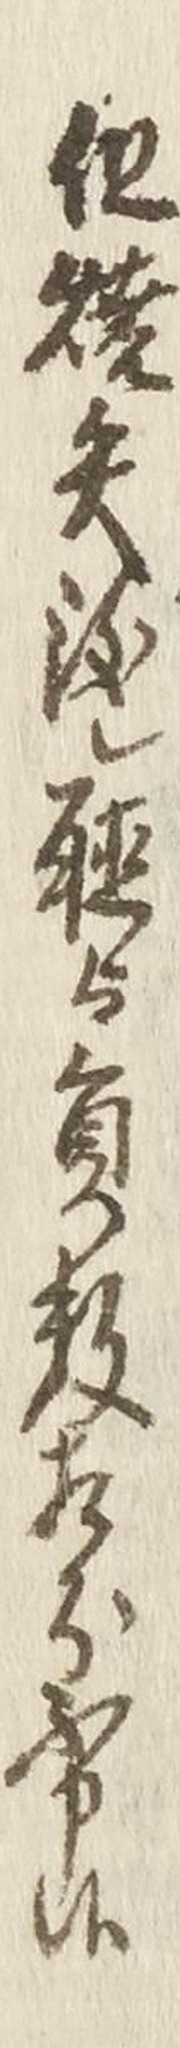但焼失致し聴と員数相分不申候
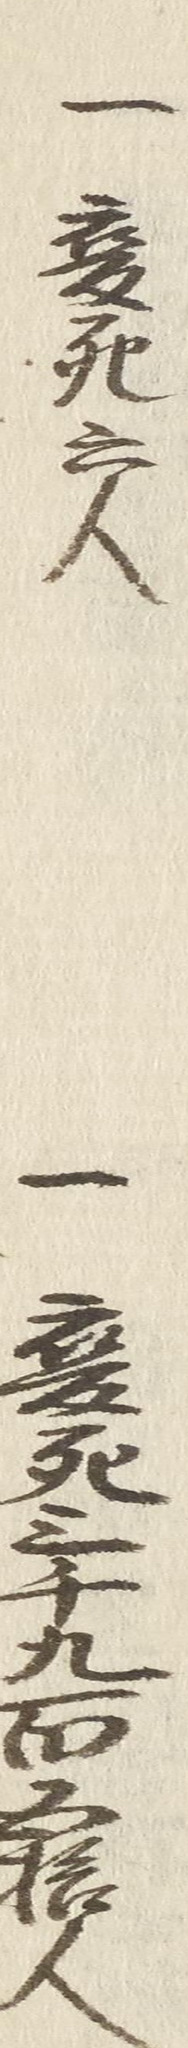一変死六人一変死三千九百五拾人
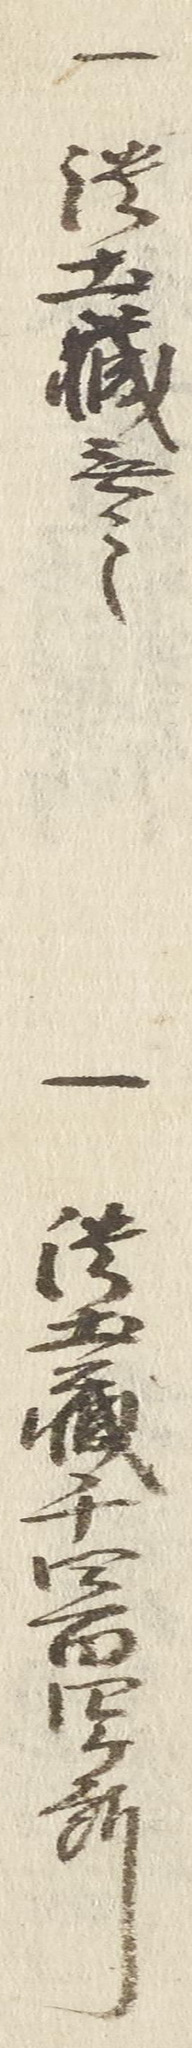一潰土蔵無之一潰土蔵千四百四ヶ所
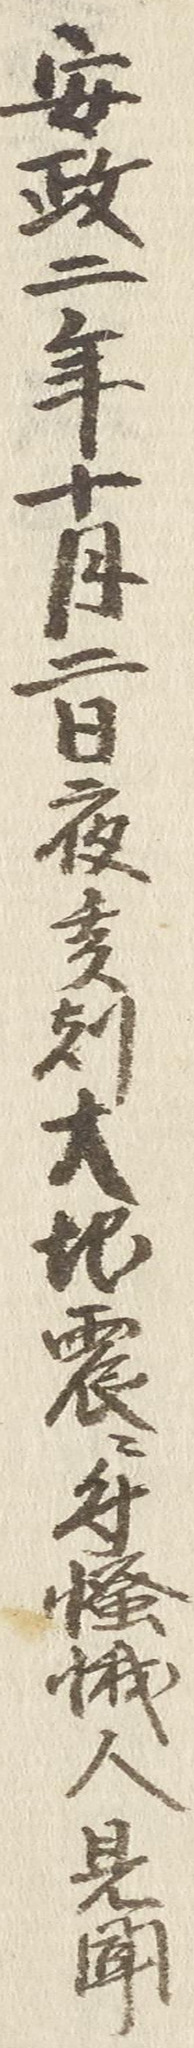安政二年十月二日夜亥刻大地震二付怪我人見聞
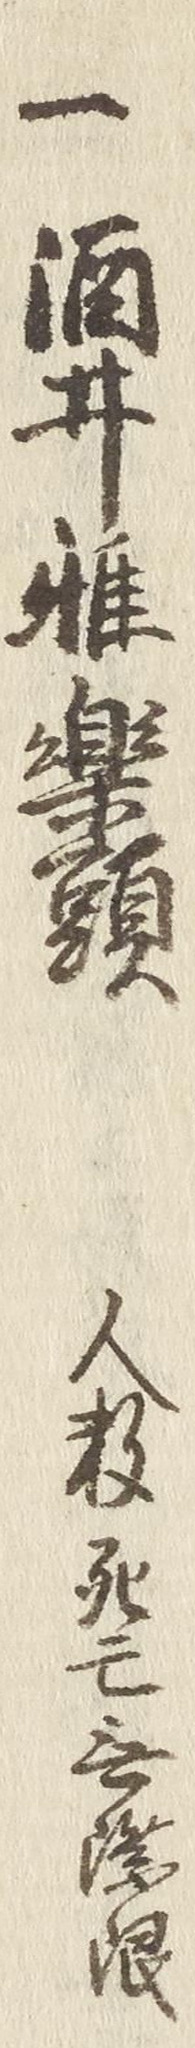一酒井雅楽頭人数死亡無際限
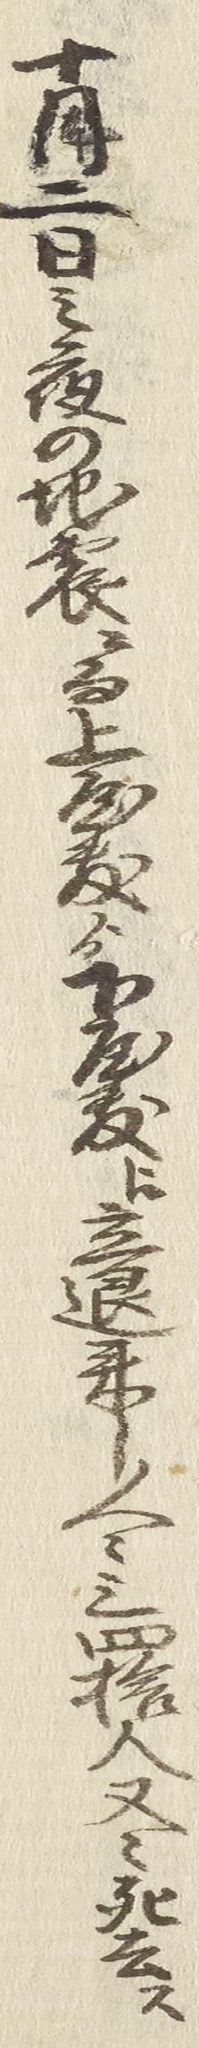十月二日之夜の地震二而上屋敷ゟ下屋敷江立退来人々三四拾人死去ス
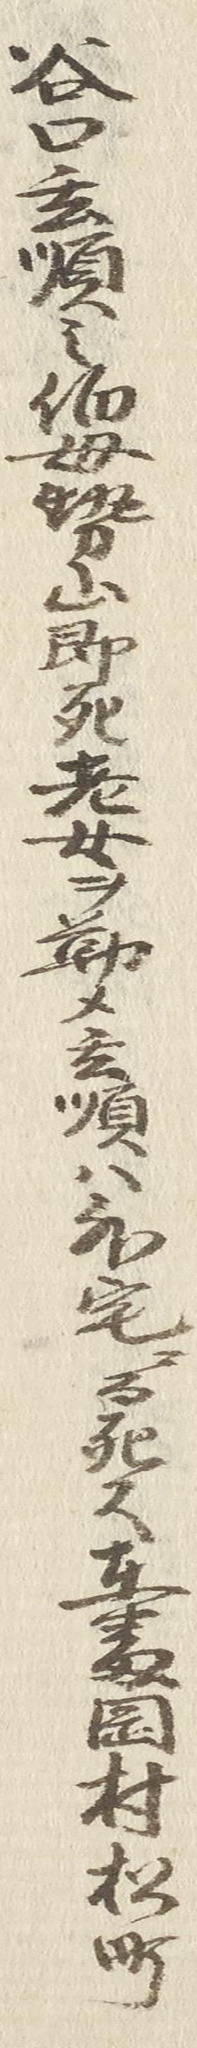谷口玄順の伯母勢山即死老女を勤メ玄順ハ外宅二而死ス在番園村松町
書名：従往古地震御届書記誌之一
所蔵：東京大学地震研究所図書室 Earthquake Research Institute Library, The University of Tokyo, JAPAN
